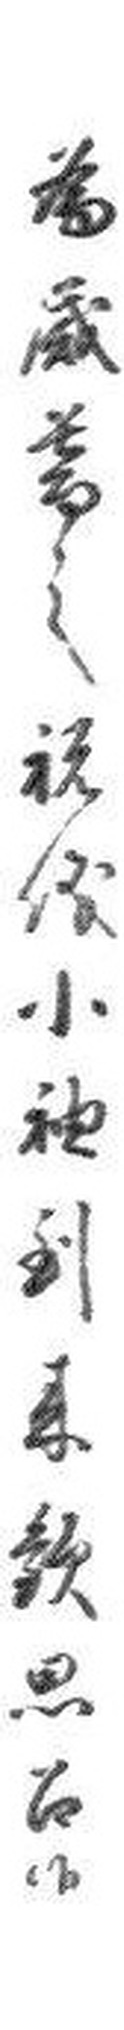為歳暮之祝儀小袖到来歓思召候
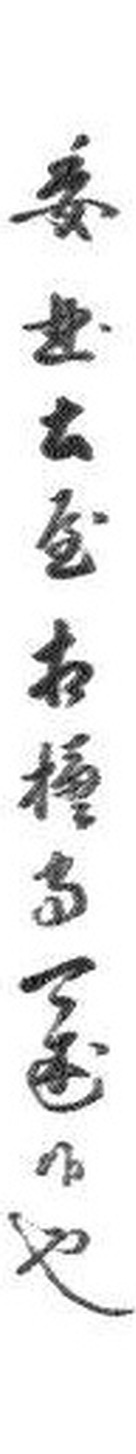委曲土屋相模守可述候也
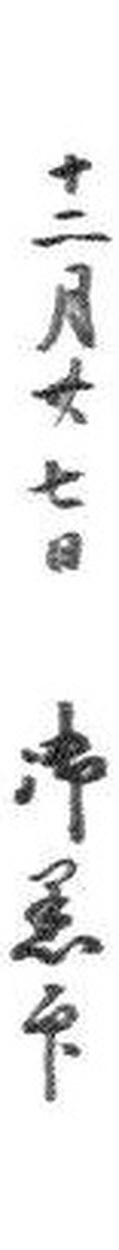十二月廿七日御黒印
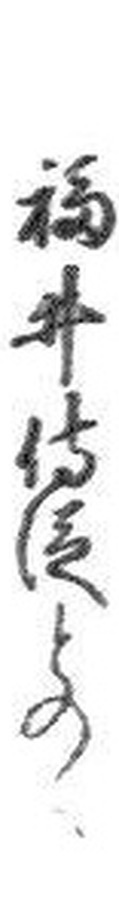福井侍従との
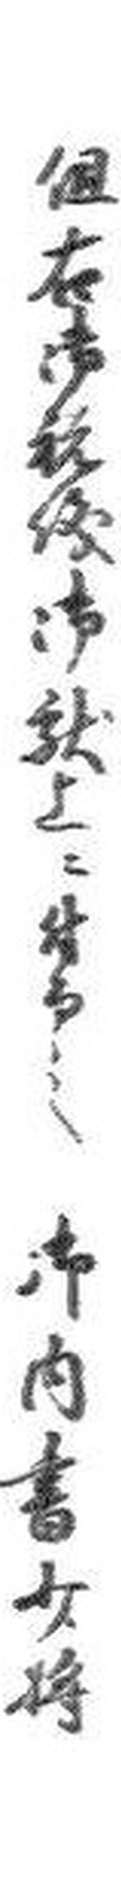但右御祝儀御献上ニ付而之御内書少将

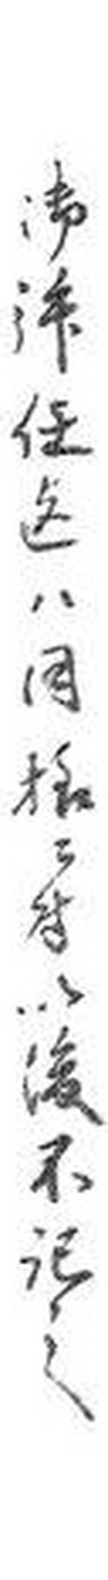御拝任迄ハ同様ニ付以後不記之
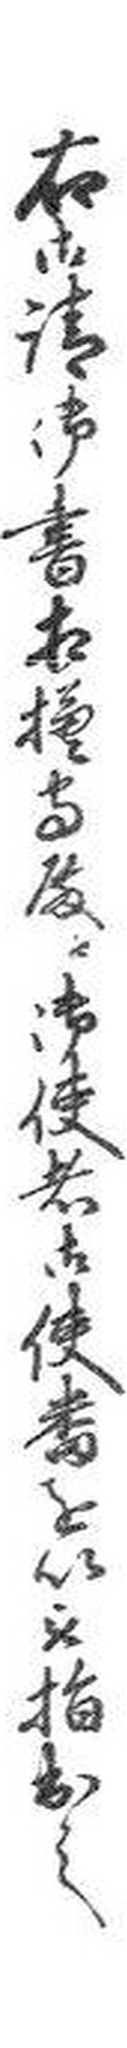右御請御書相模守殿江御使者御使番を以被指出之
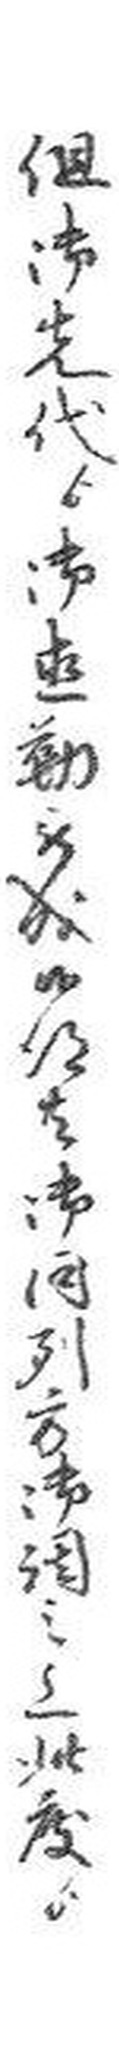但御先代ゟ御直勤被成候得共御同列方御調之上此度ゟ
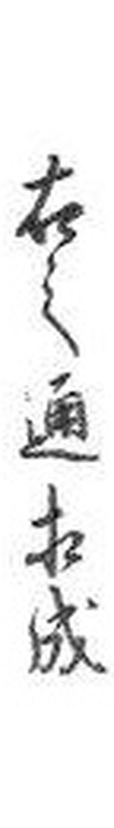右之通相成
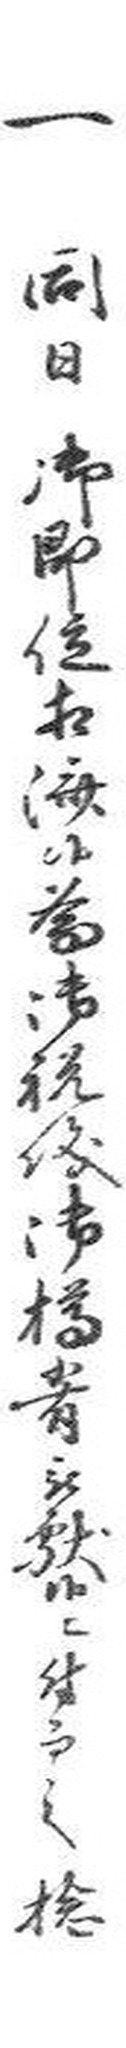一同日御即位相済候為御祝儀御樽肴被献候ニ付而之捻
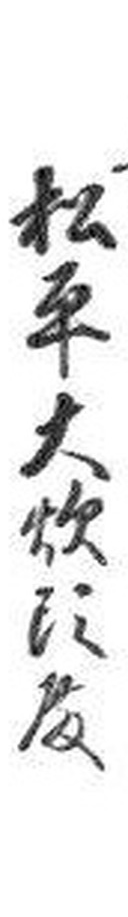松平大炊頭殿正岑
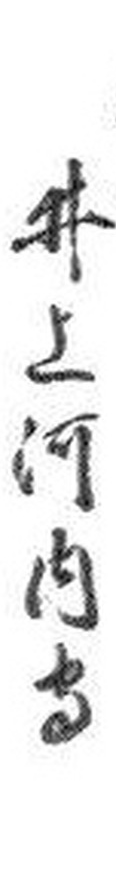井上河内守
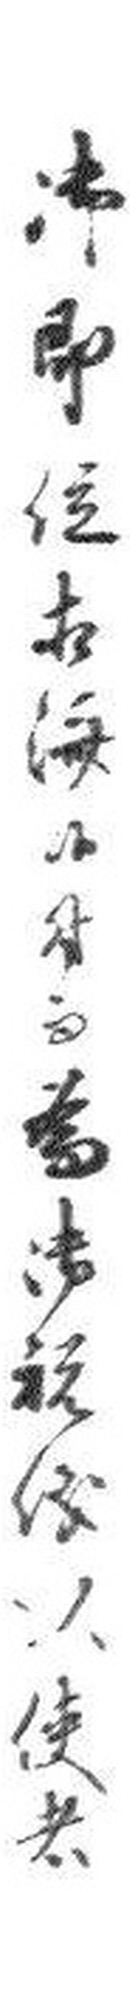御即位相済候付而為御祝儀以使者
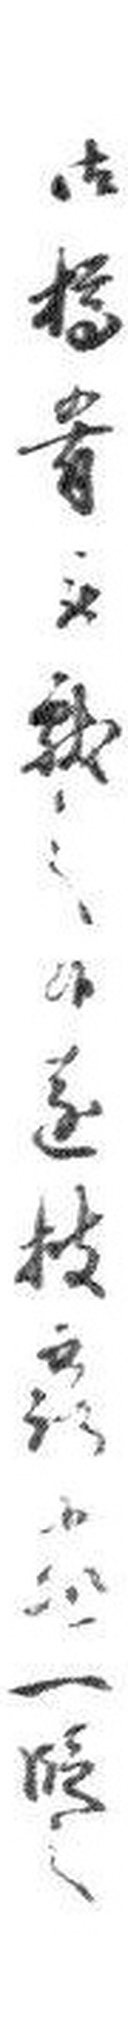御樽肴被献之候遂披露候処一段之
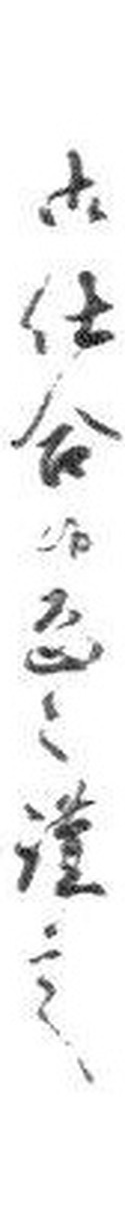御仕合候恐々謹言
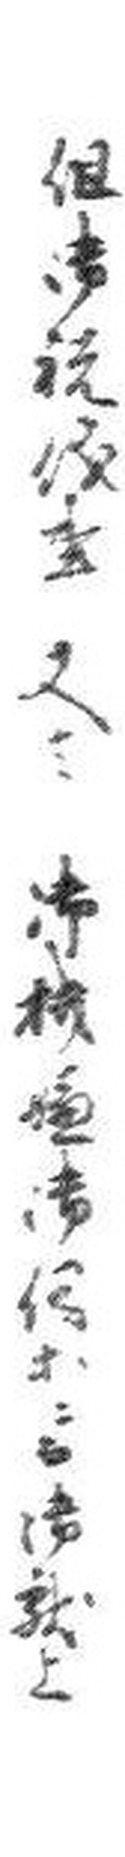但御祝儀事又者御機嫌御伺等ニ而御献上
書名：家譜 二十八 吉邦公 従宝永七年七月五日到正徳元年十二月
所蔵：福井県文書館 Fukui Prefectural Archives
